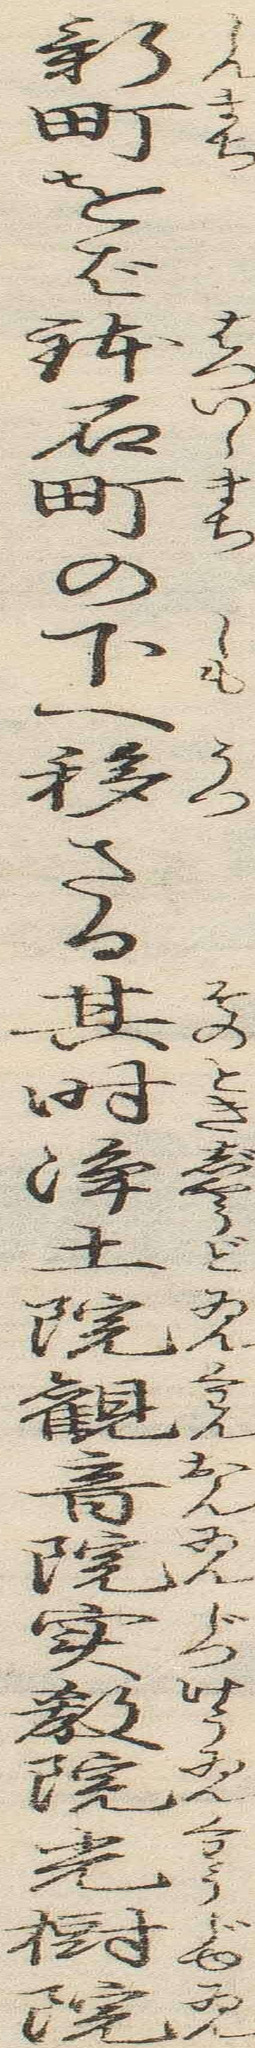新町をば鉢石町の下へ移さる其时淨土院観音院実敎院光樹院
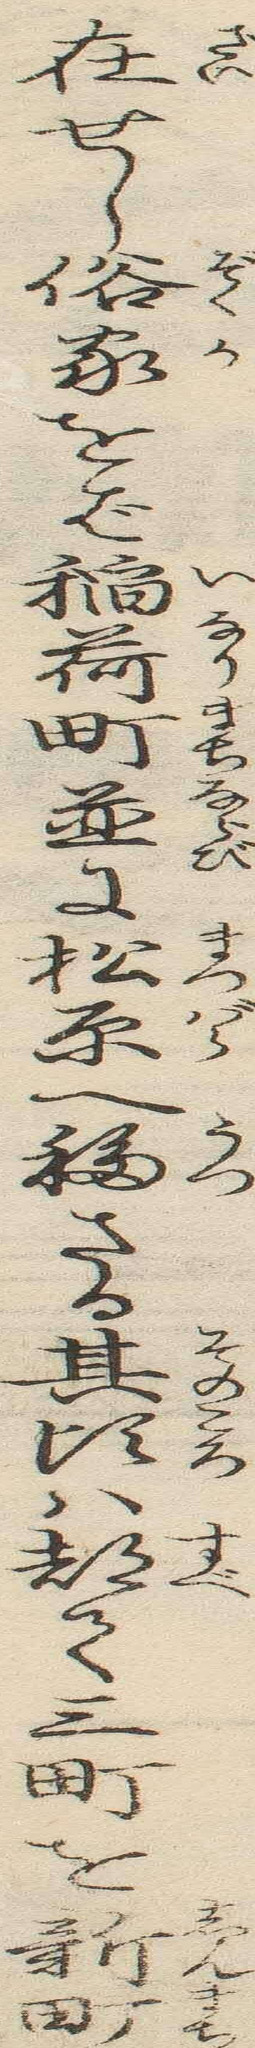在せし俗家をば稲荷町並に松原へ移さる其頃は都て三町を新町
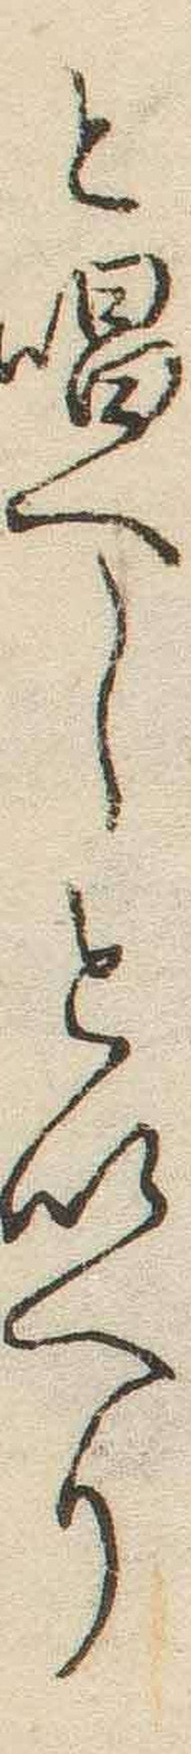と唱へしといへり
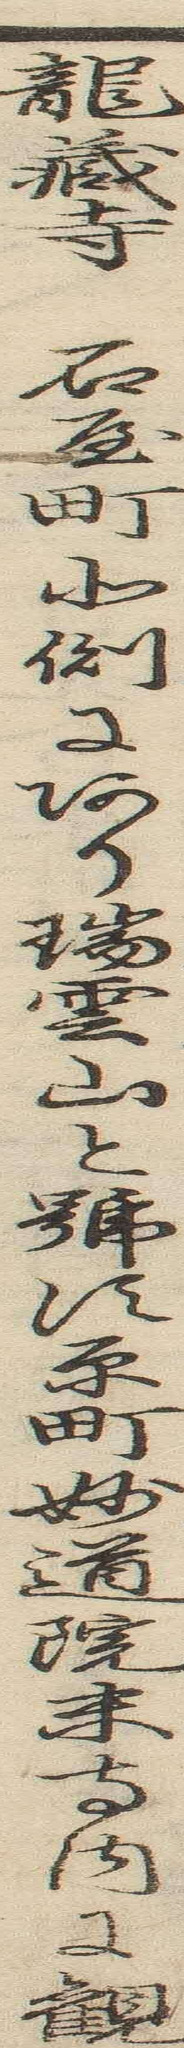龍藏寺石屋町北側にあり瑞雲山と號す原町妙道院末寺内に観

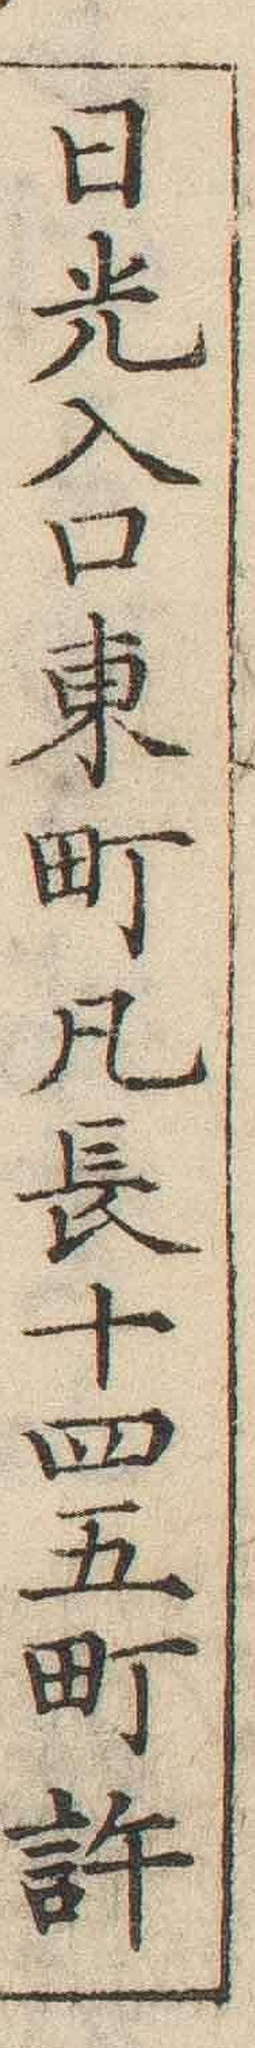日光入口東町凡長十四五町許
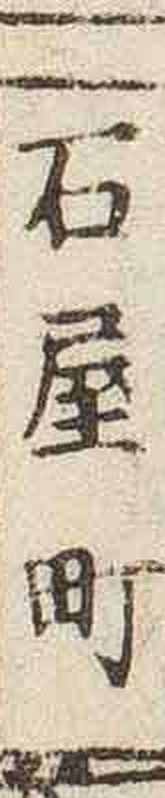石屋町

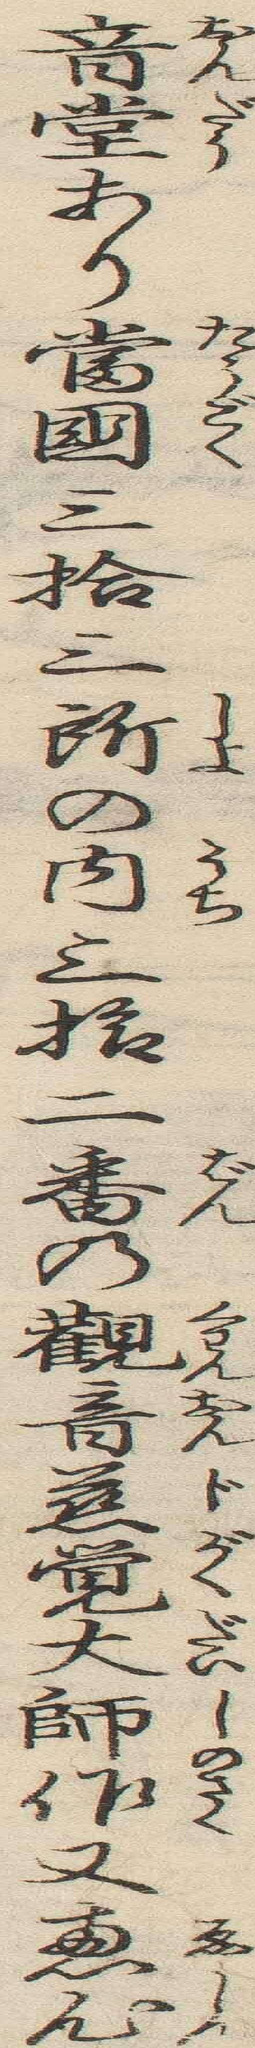音堂あり當國三拾三所の内三拾二番の觀音慈覚大師作又恵心
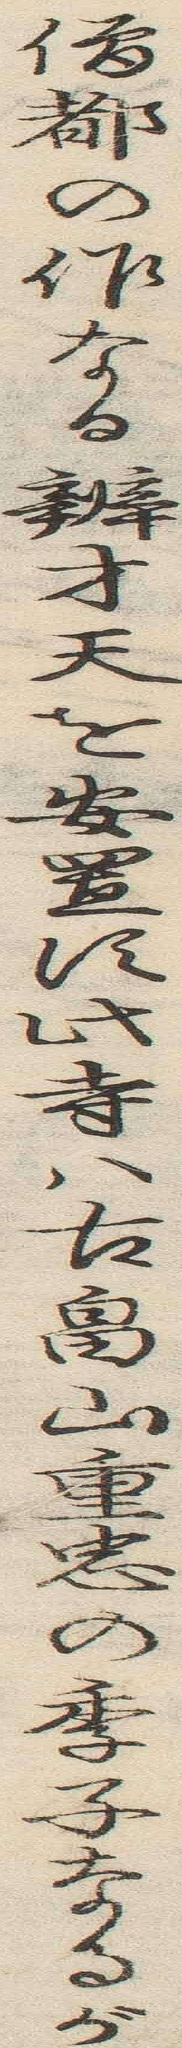僧都の作なる辨才天を安置す此寺は古畠山重忠の季子なるが
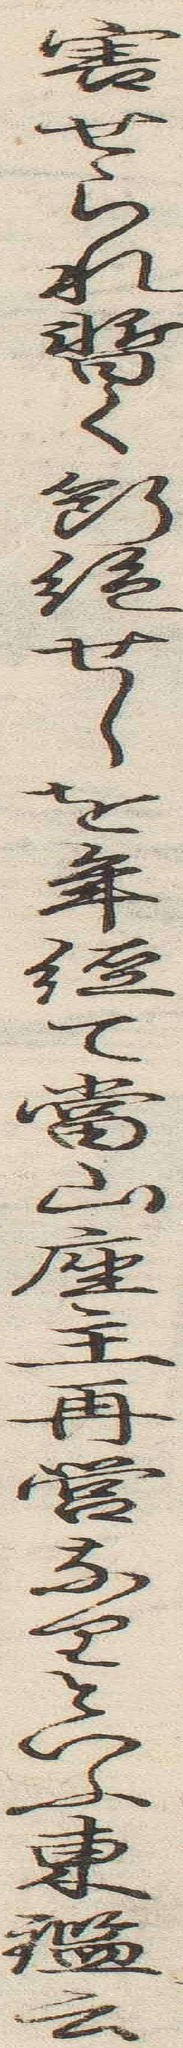害せられ暫く断絶せしを年經て當山座主再営なりといふ東鑑云
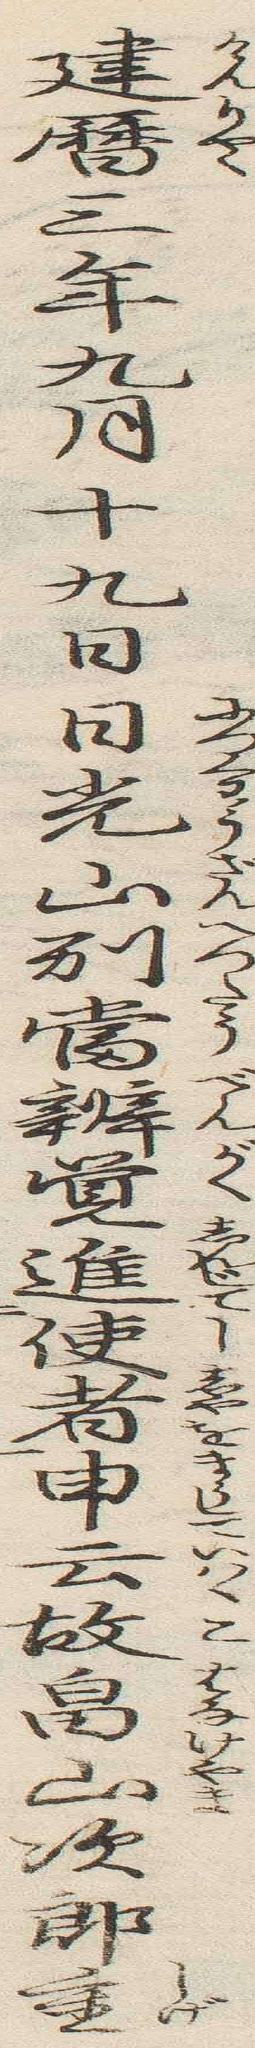建曆三年九月十九日日光山別當辨覚進使者申云故畠山次郎重
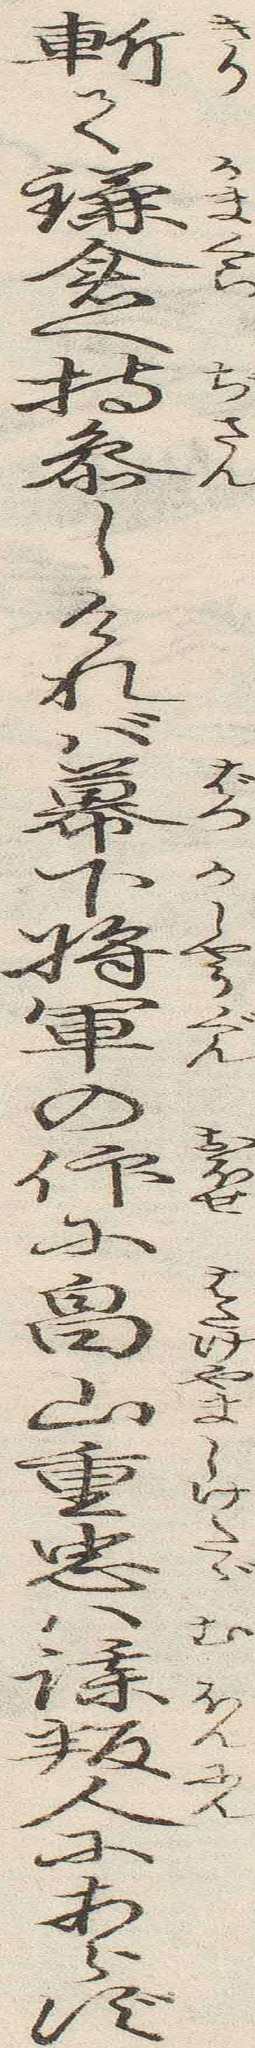斬て鎌倉へ持参しければ幕下将軍の仰に畠山重忠は謀叛人にあらず
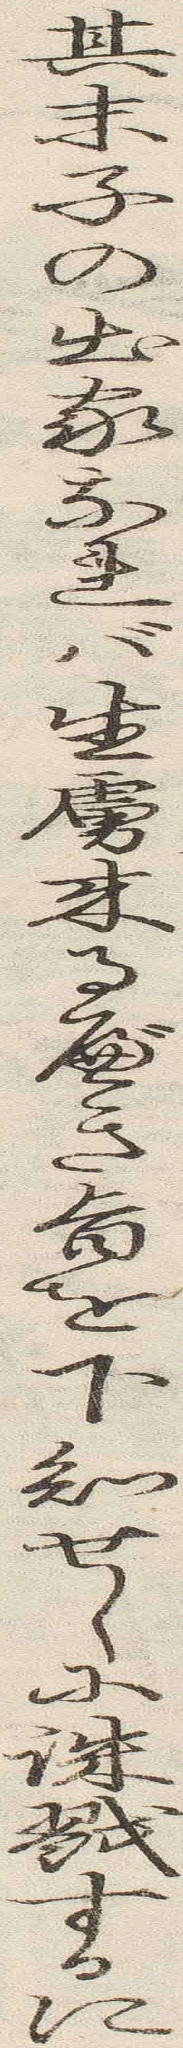其末子の出家なれば生虜来るべき旨を下知せしに誅戮するに
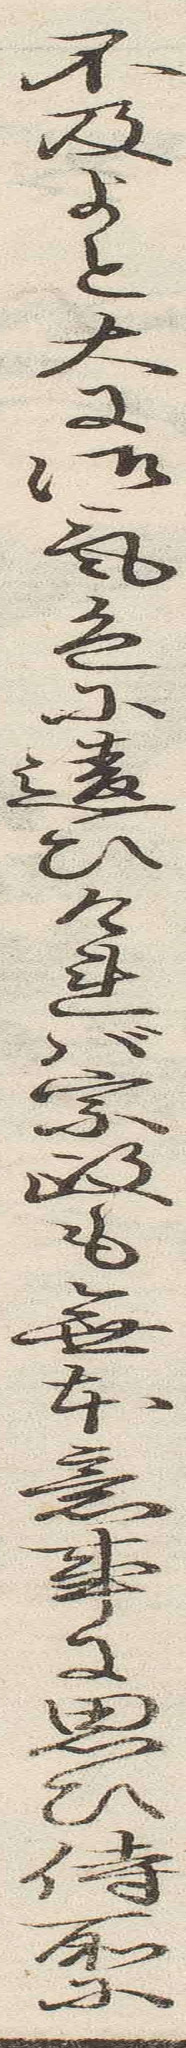不及よと大に御気色に違ひければ宗政も無本意事に思ひ侍所に
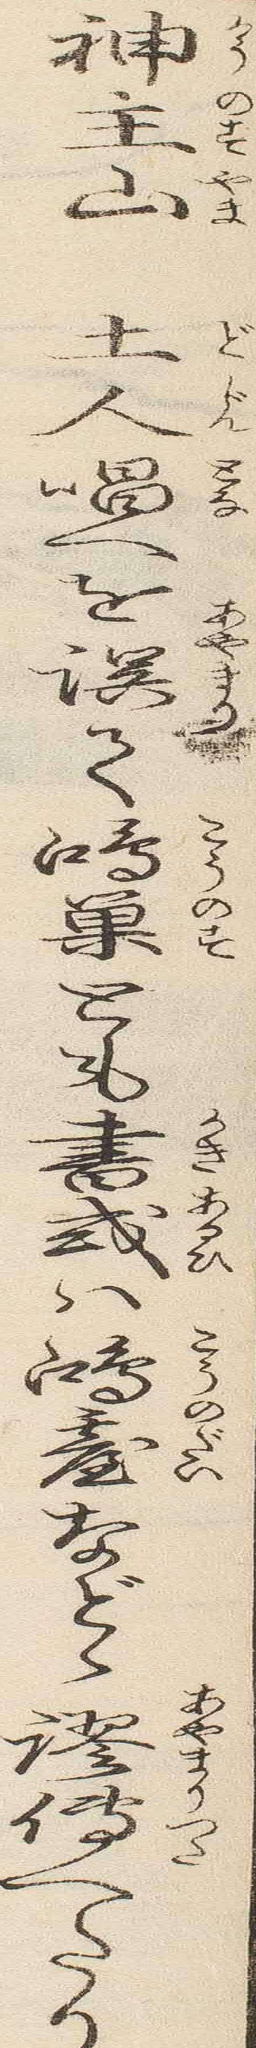神主山土人唱へを誤て鴻巣とも書或は鴻臺などゝ謬傳へたり
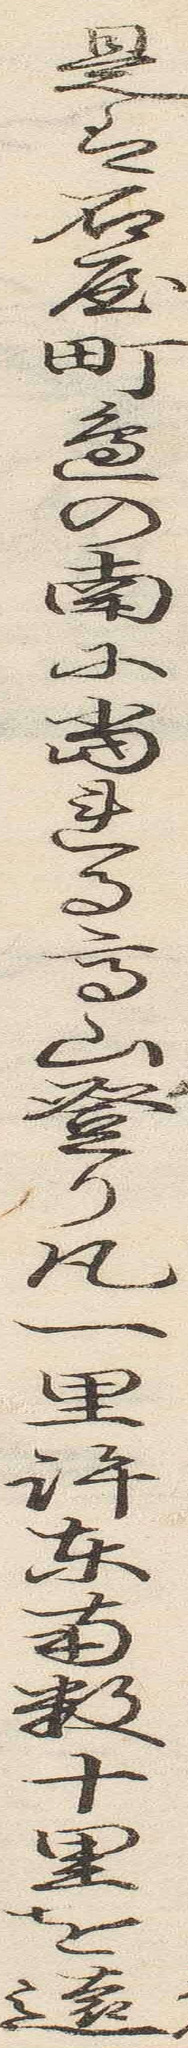是は石屋町邊の南に當れる高山登り凡一里許東南数十里を遠
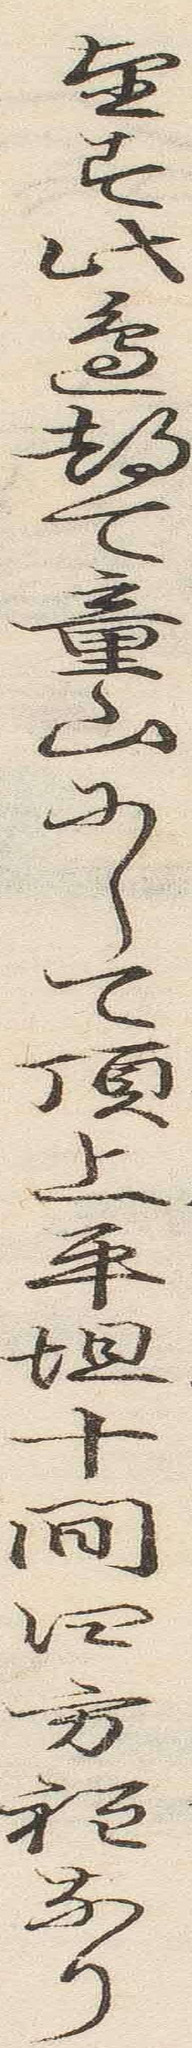望す此邊都て童山にして頂上平坦十間四方程なり
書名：日光山志
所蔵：東京学芸大学附属図書館 国文学研究資料館
